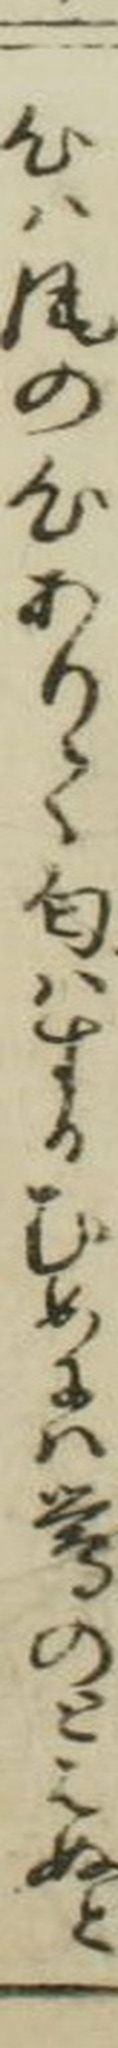心は風の心ありて匂はするむめには鶯のとはぬと
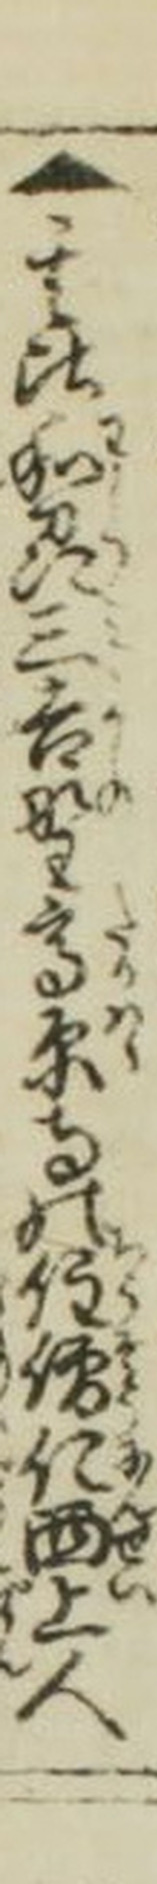▲其頃和刕三吉野高原寺の住僧仁西上人
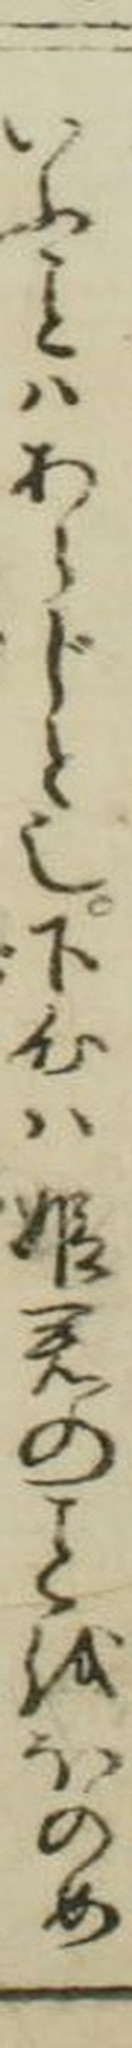いふことはあらじと也。下心は姫君のことをほのめ
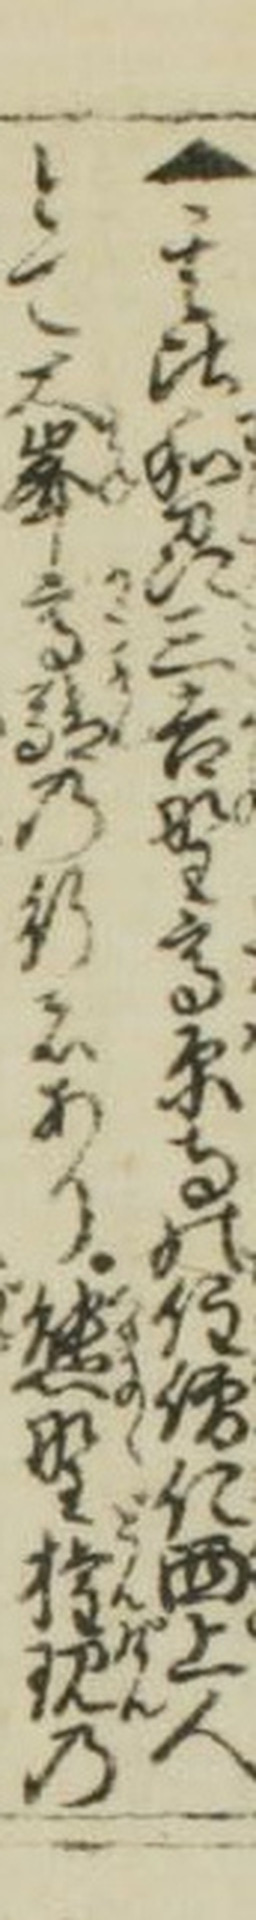とて大峯高験の行者あり。熊野権現の
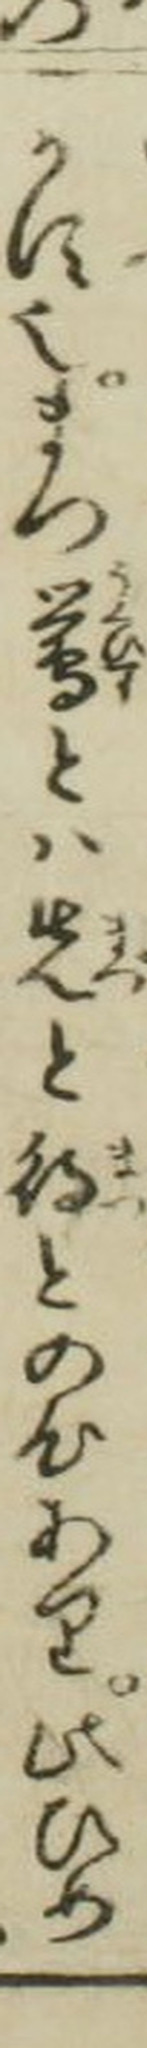かす也。まつ鶯とは先と待との心あり。此ひめ
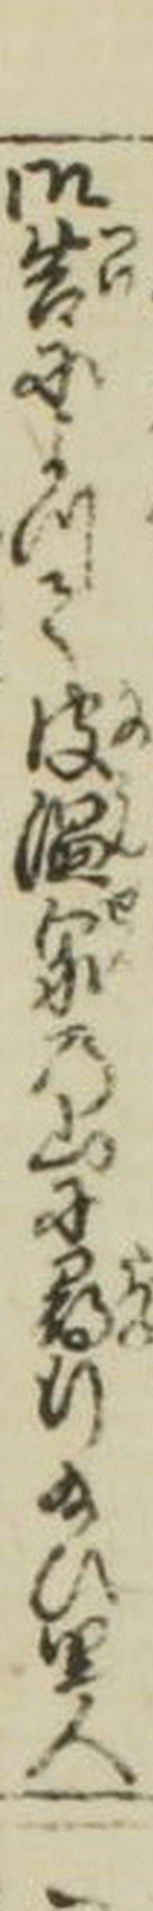御吿によつて彼温泉の山に尋行給ひ里人
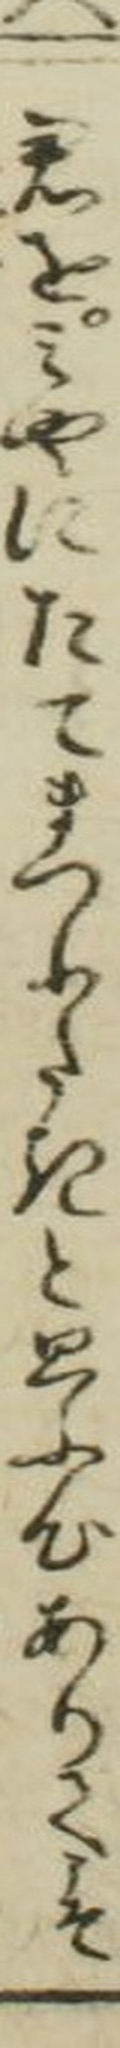君を。みやにたてまつりたきと思ふ心ありてこそ。
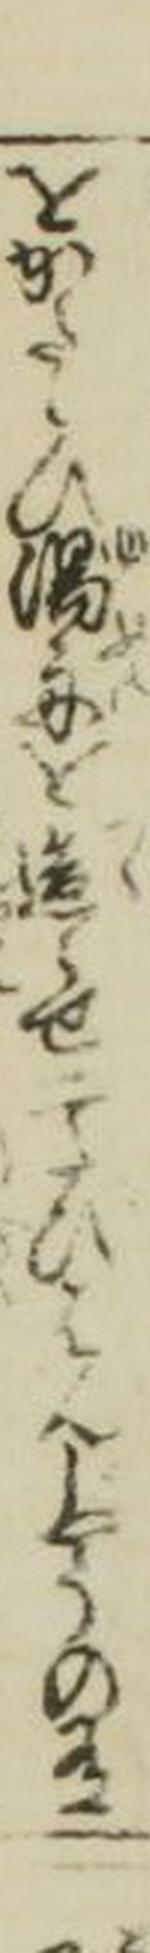をかたらひ湯舟を造らせ二たびはんじやうの有
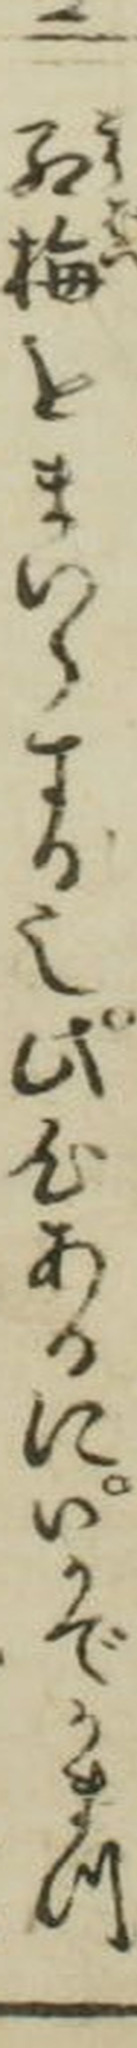紅梅をまいらする也。此心あるに。いかでかまつ
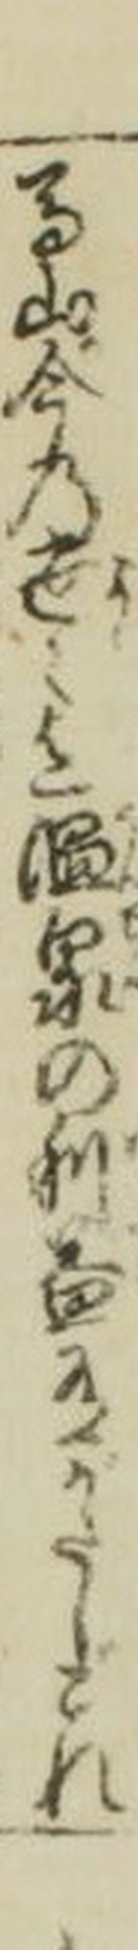馬山。今の世〻迄温泉の利益有がたし。これ
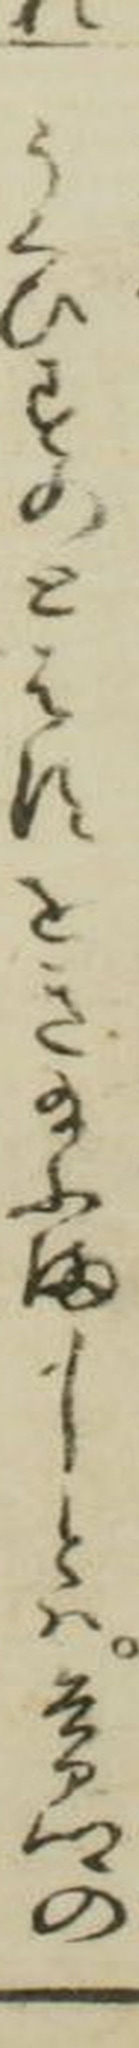うくひすのとはすをき給ふましとは。兵部卿の
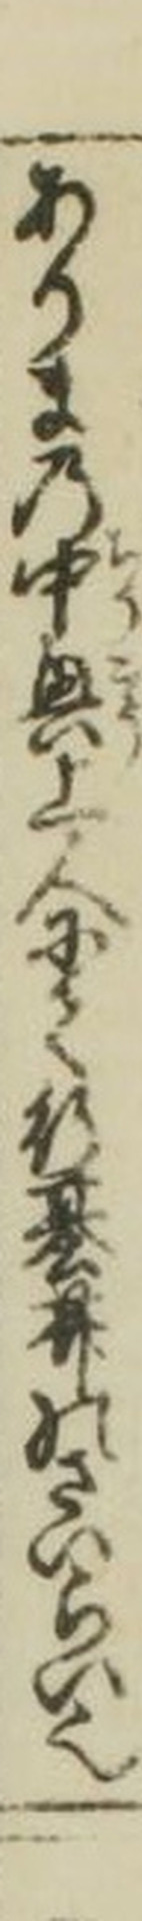ありまの中興上人にて行基𦬇のさいらい也
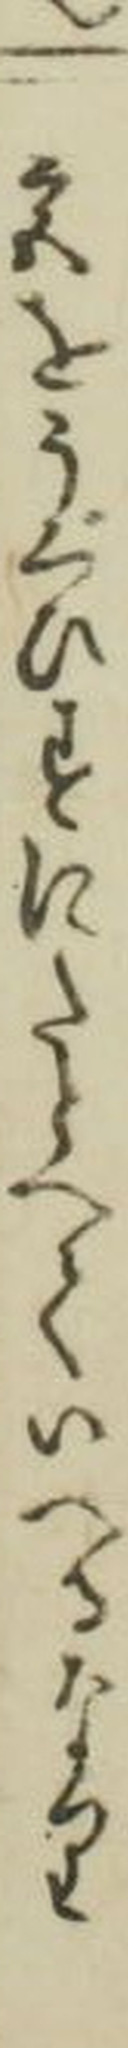宮をうぐひすにたとへていへるなり
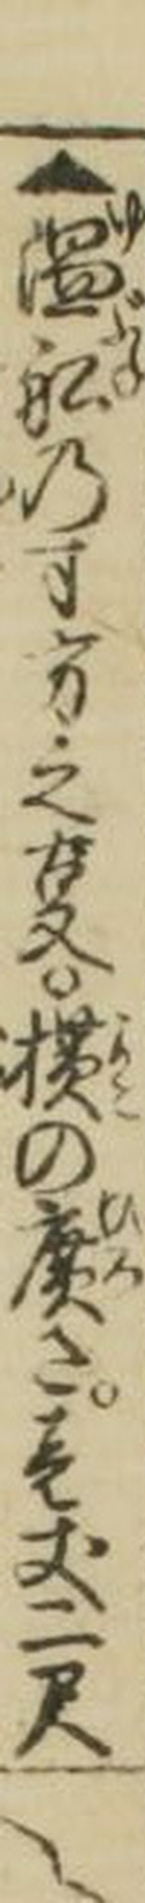▲湯船の寸方之事○横の廣さ。壱丈二尺
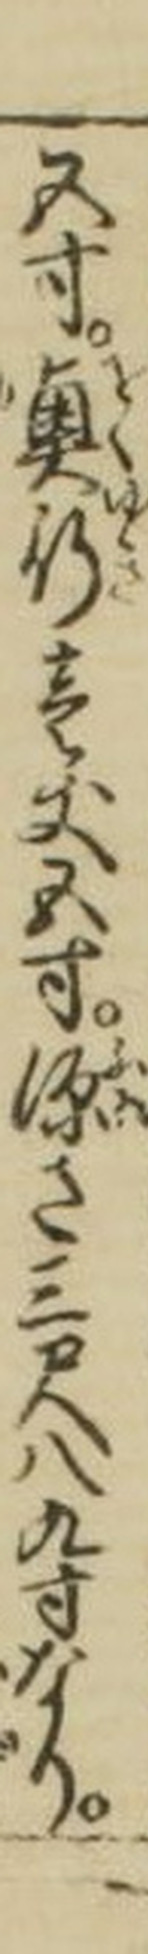五寸。奥行壱丈五寸。深さ三尺八九寸なり。
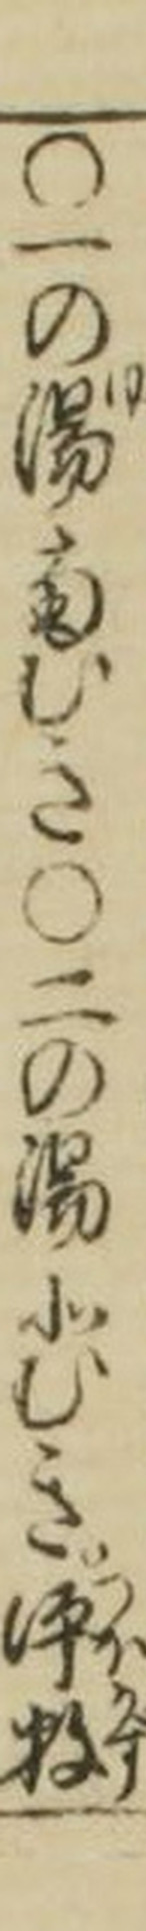○一の湯南むき○二の湯北むき。坪数
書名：女源氏教訓鑑
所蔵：東京学芸大学附属図書館
